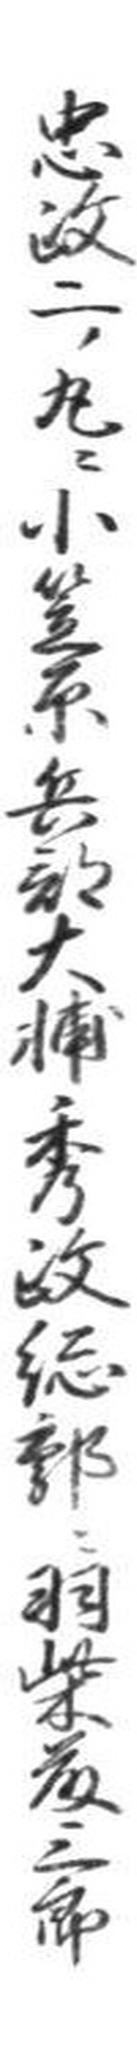忠政二ノ丸ニ小笠原兵部大輔秀政総郭ニ羽柴藤三郎
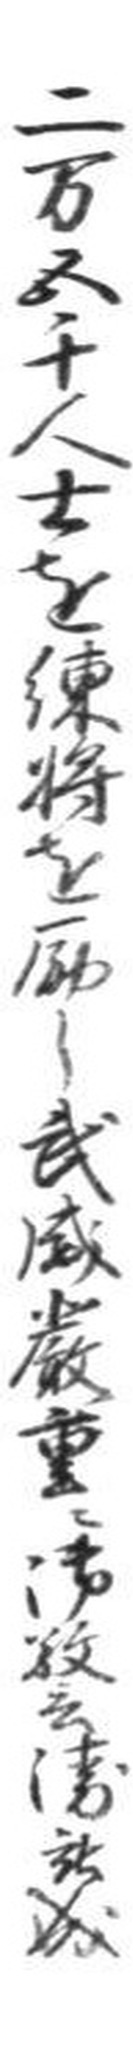二万五千人士を練将を励し武威厳重ニ御警衛被成
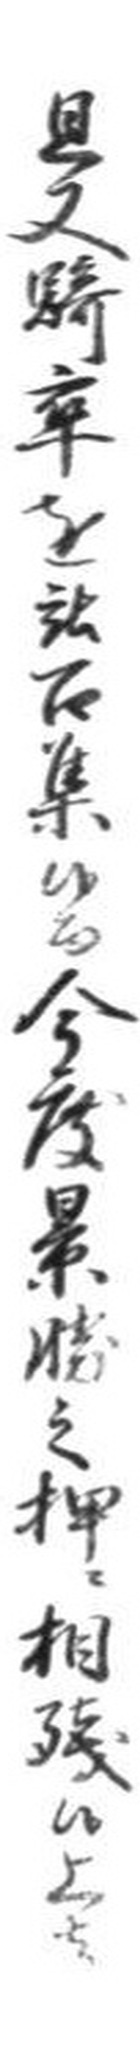且又騎卒を被召集候而今度景勝之押ニ相残候上者
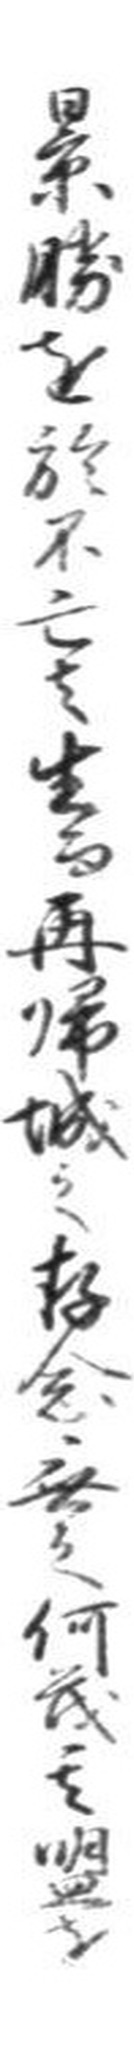景勝を於不亡者生而再帰城之存念無之何も其盟を
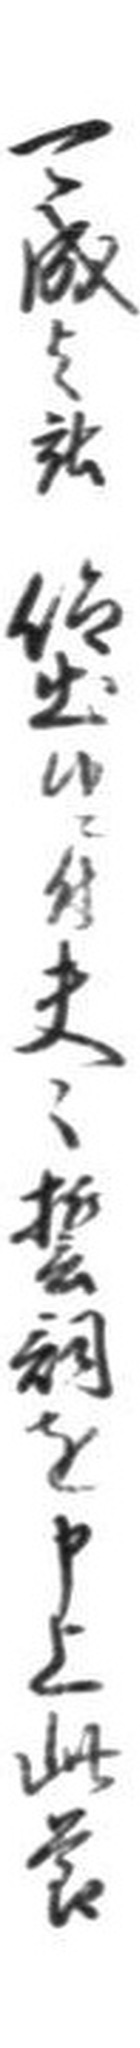可成と被仰出候ニ付夫々誓詞を申上此節
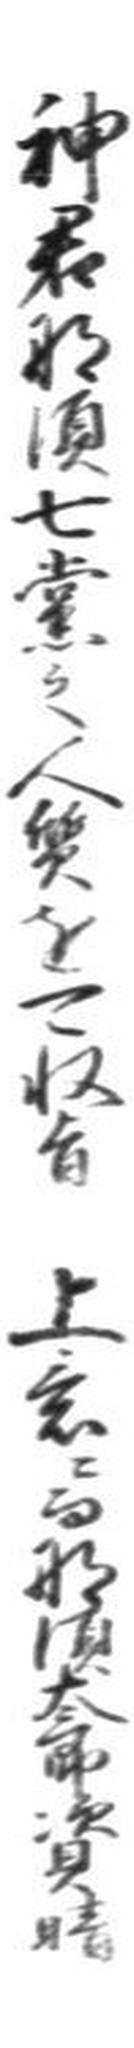神君那須七党之人質を可収旨上意ニ而那須大三郎資晴
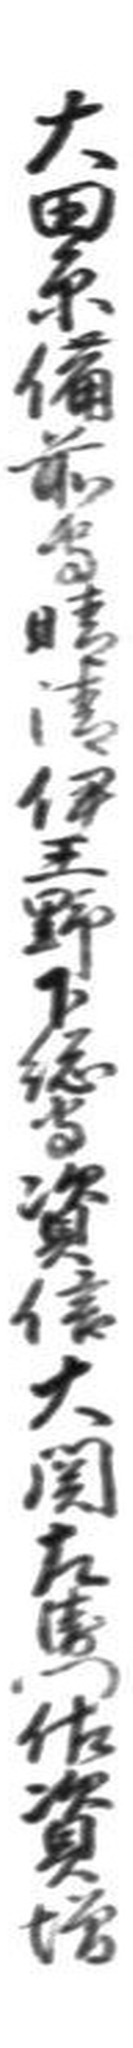大田原備前守晴清伊王野下総守資信大関左衛門佐資増
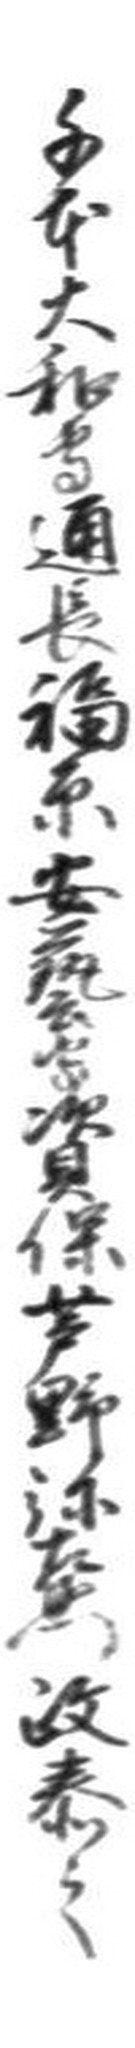千本大和守通長福原安芸守資保芦野弥左衛門政泰之
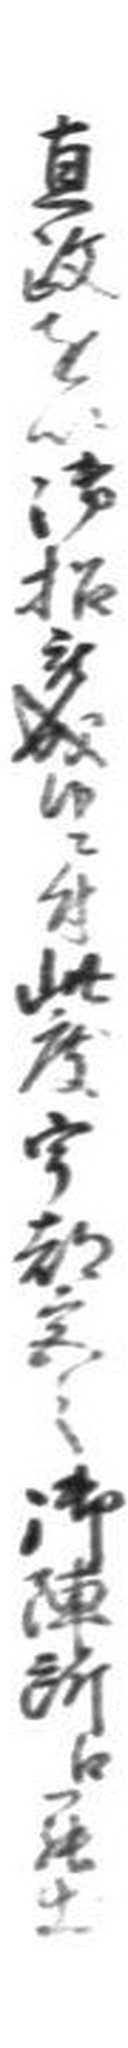直政を以御招被成候ニ付此度宇都宮之御陣所江罷出
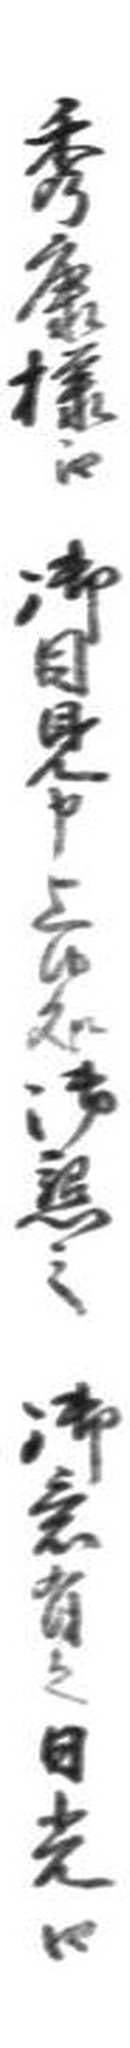秀康様江御目見申上候処御懇之御意有之日光口
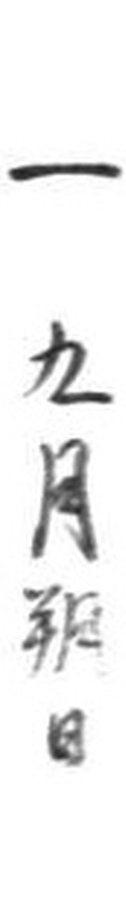一九月朔日
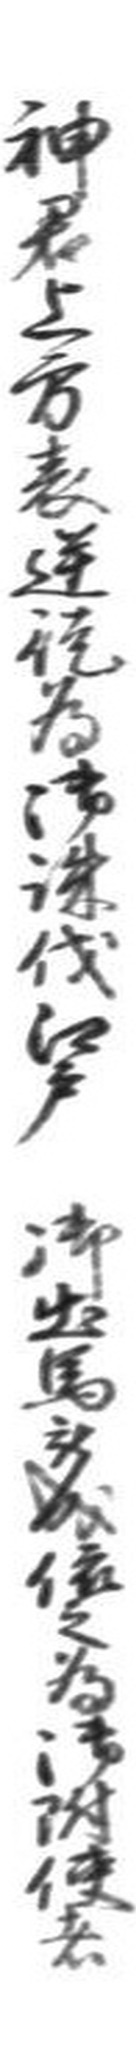神君上方表逆徒為御誅伐江戸御出馬被成依之為御附使者

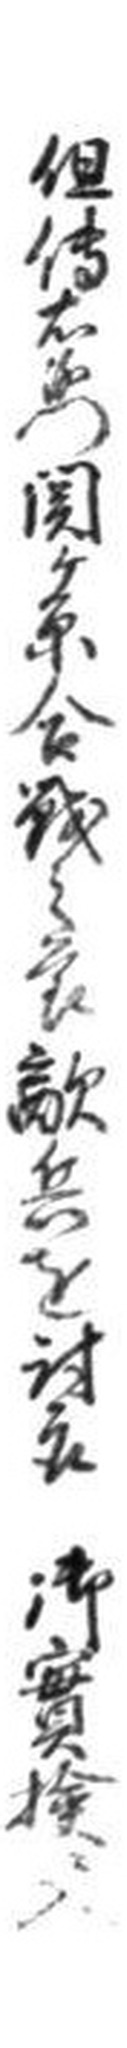但伝右衛門関ケ原合戦之節敵兵を討取御実検ニ入
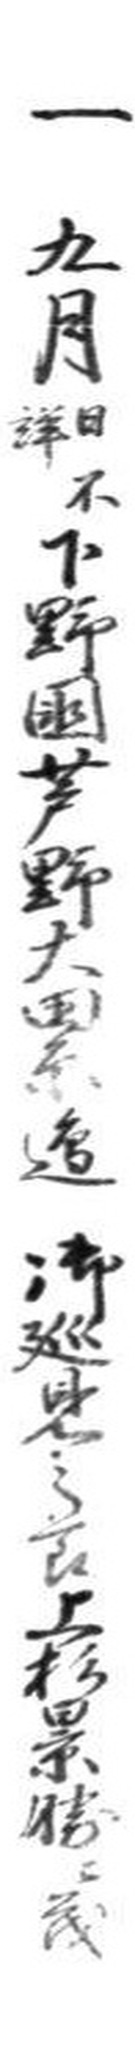一九月日不詳下野国芦野大田原辺御巡見之節上杉景勝ニも
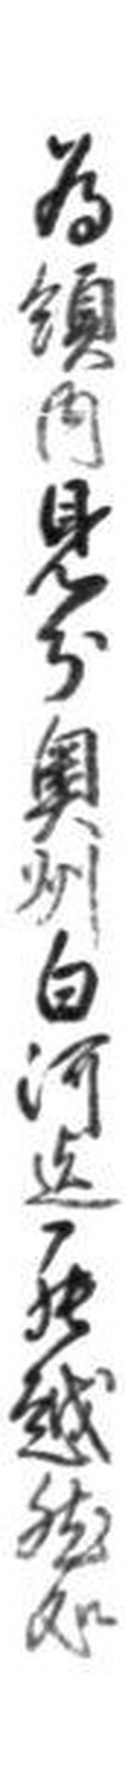為領内見分奥州白河迄罷越然処
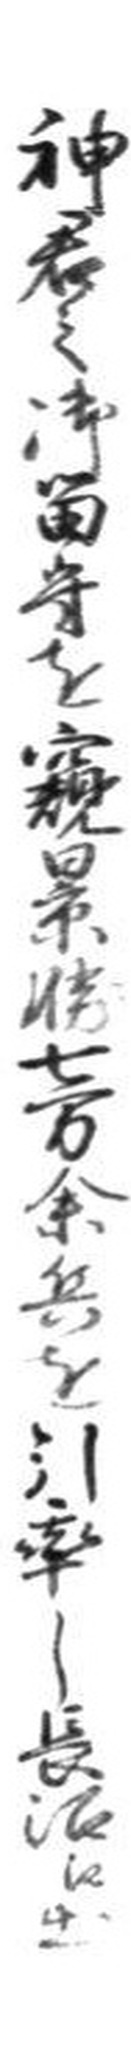神君之御留守を窺景勝七万余兵を引率し長沼江出
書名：家譜 一 秀康公 従天正二年到慶長十二年
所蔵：福井県文書館 Fukui Prefectural Archives
